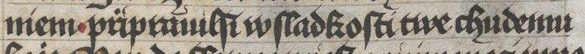niem.pṙiprauilſi wſladkoſti twe chudemu
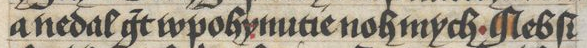a nedal ḡt wpohynutie noh mych.Neb ſi
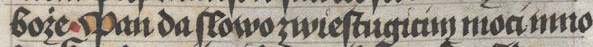boże.Pan da ſlowo zwieſtugicím moci mno¬
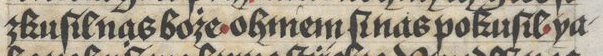zkuſil nas boże.ohniem ſi nas pokuſil.ya¬
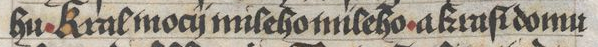hu.Kral mocij mileho mileho.a kraſi domu
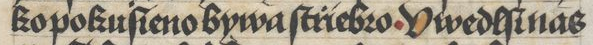ko pokuſíeno bywa ſtṙiebro.Ywedlſi nas
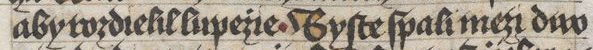aby rozdielil lupeżie.Byẛte ſpali mezi dwo¬
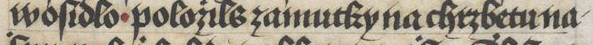woſidlo.polożils zamutky na chrzbetu na¬
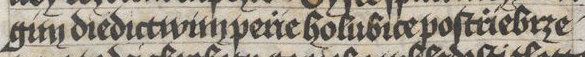gim diedictwím peṙíe holubice poſtṙiebrze¬
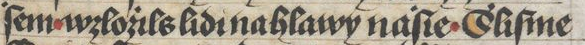ẛem.wzlożils lidi nahlawy naẛie.Ṡliſme
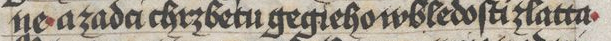ne.a zadci chrzbetu gegieho wbledoſti zlatta.
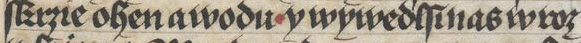ſkrzie ohen a wodu.y wywedlſi nas w roz¬
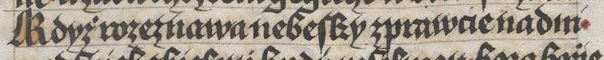Kdyż rozeznawa nebeſky zprawcie nadní
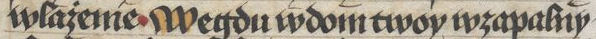wlażenie.Wegdu w dom twoy wzapalny
